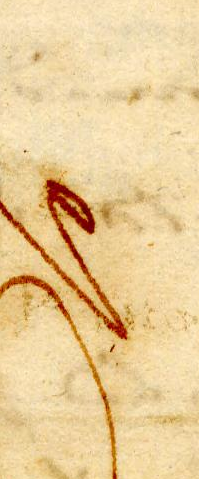To
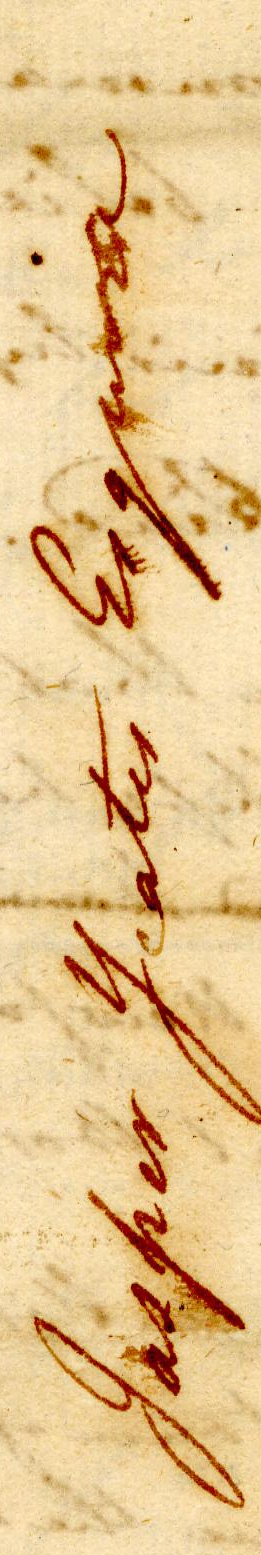Jasper Yeates Esquire
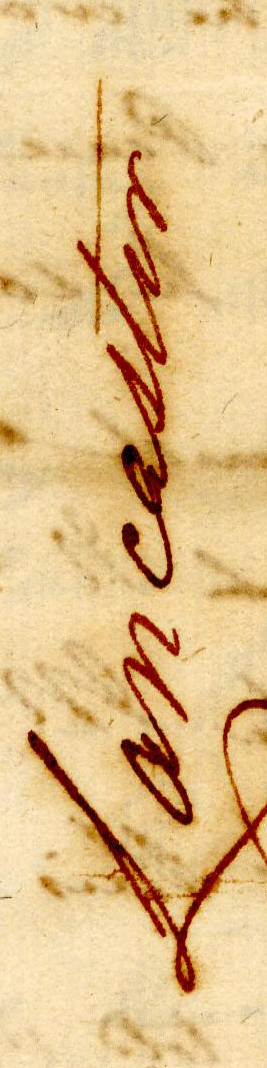Lancaster
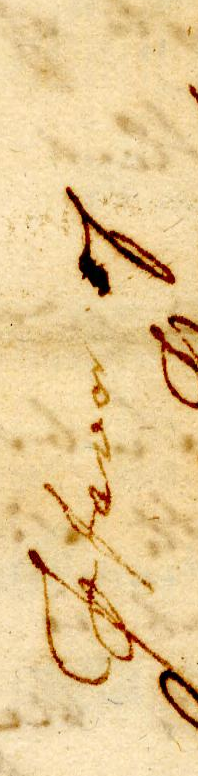Per favor of
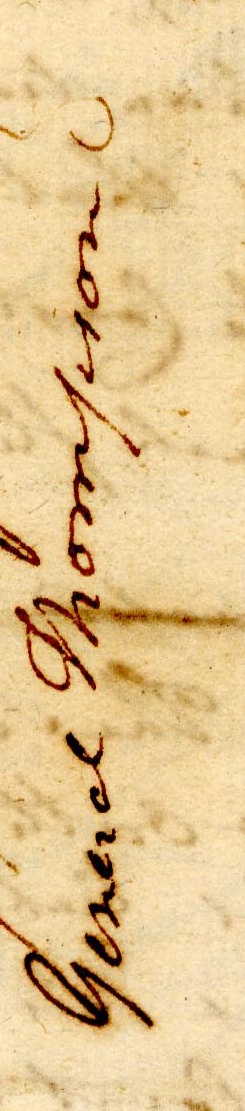General Thompson
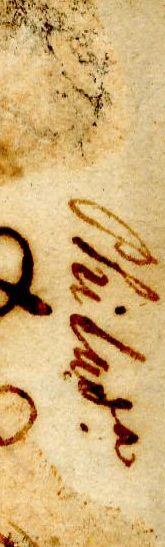Philad^a.
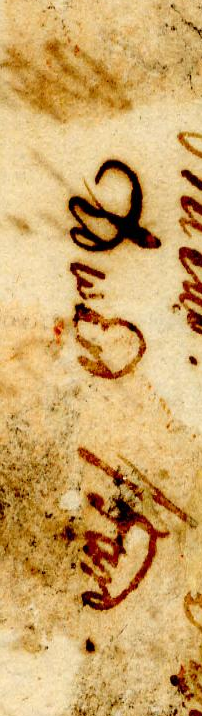Edward Burd
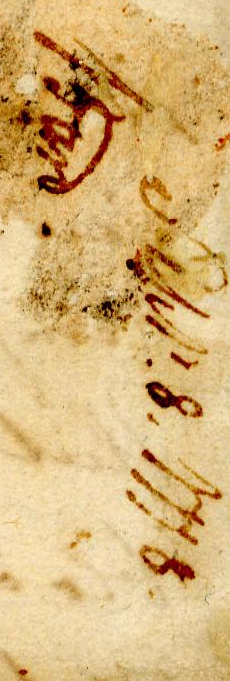Sept^r. 8. 1778.
